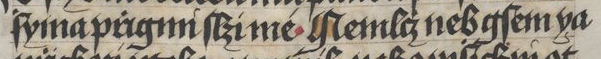ẛyma pṙigmi ſlzí mé.Nemlcṙ neb gſem ya
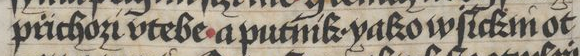pżṙichozí vtebe.a putník.yako wẛickni ot¬
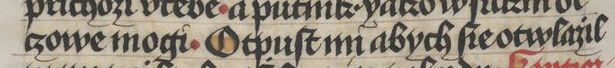czowé mogi.Otpuſt mi abych ſie otwlażil
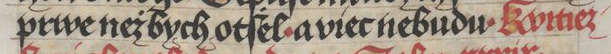prwe neż bych otẛel.a víec nebudu.Kvitez¬
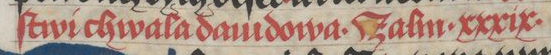ſtwí chwala dauidowa.Zalm.xxxix.
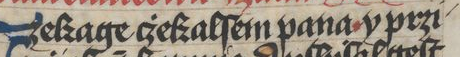zekage cżekalſem pana.y przi¬
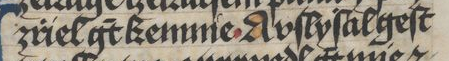zṙíel ḡt kemnie.A vſlyẛal geſt
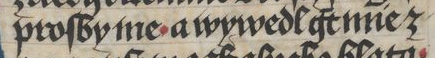proſby me.a wywedl ḡt mie z
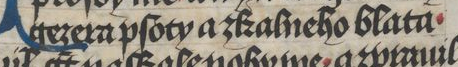gezera pſoty a zkalneho blata.
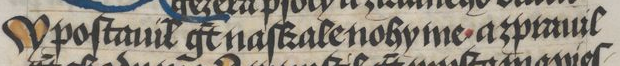Y poſtauil ḡt naſkale nohy me.a zprauil
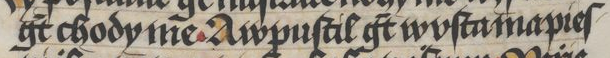ḡt chody me.Awpuſtil ḡt wvſta mapieſ¬
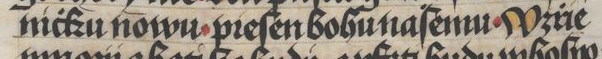niċku nowu.pieſen bohu naẛemu.Vzṙíe
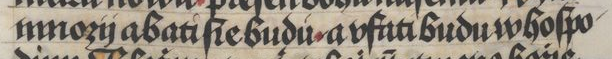mnozij abati ſie budú.a vſati budu w hoſpo¬
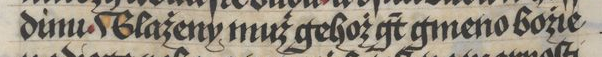dinu.Blaženy muž gehož ḡt gmeno božie
